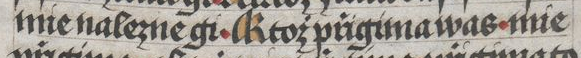mie.nalezne gi.Ktoż pṙigíma was.mie
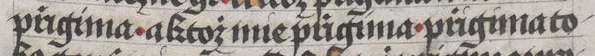pṙigima.a ktoż mie pṙigima.pṙigima to¬
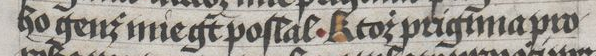ho genż mie ḡt poſlal.Ktoż pṙigima pro¬
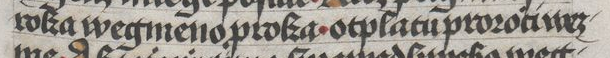roka wegmeno ꝓroka.otplatu proroċí wez¬
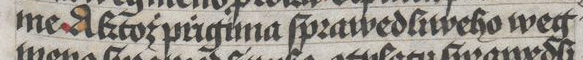me.A ktoż pṙigima ſprawedliweho weg¬
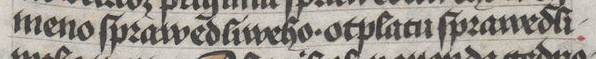meno ſprawedlíweho.otplatu ſprawedli¬
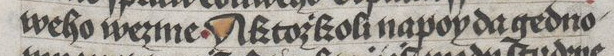weho wezme.Aktożkoli napoy da gedno¬
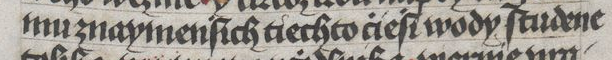mu znaymenẛich tiechto ċíeẛi wody ſtudene
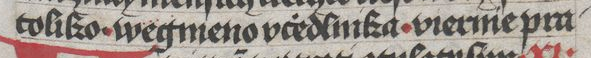toliko.wegmeno vċedlníka.viernie pra¬
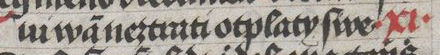ui wā neztrati otplaty ſwe.xi.
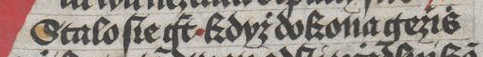Stalo ſie ḡt.kdyż dokona geżíṡ
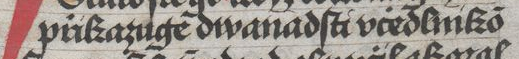pṙikazuge dwanadſti vċedlníkō
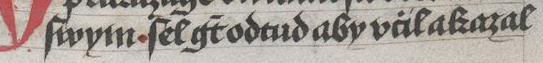ſwym.ſel ḡt odtud aby vċil a kazal
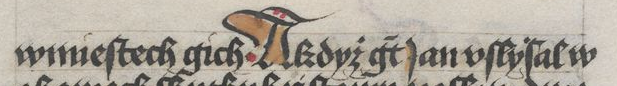wmieſtech gich. A kdyż ḡt Ian vſlyẛal w
